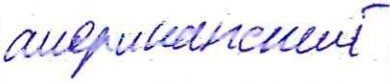американский
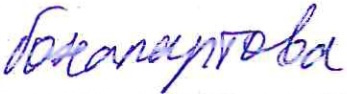бонапартова
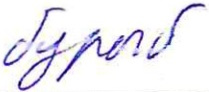бурый
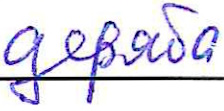деряба
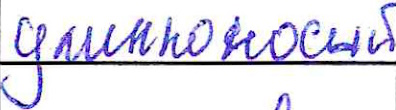длинноносый
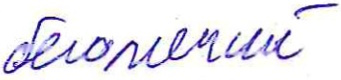белоплечий
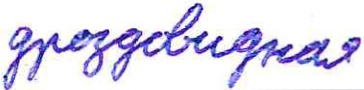дроздовидная
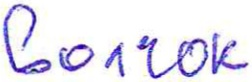волчок
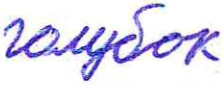голубок
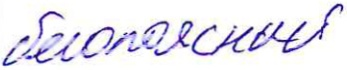белопоясный
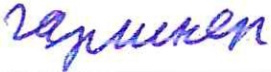гаршнеп
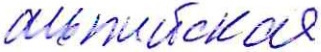альпийская
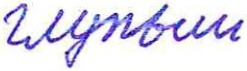глупыш
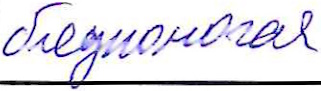бледноногая
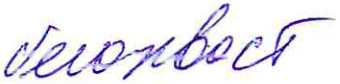белохвост
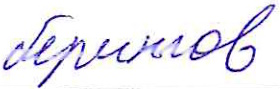берингов
